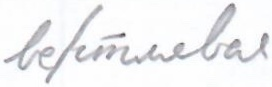вертлявая
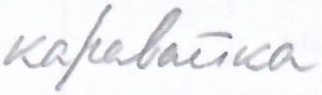каравайка
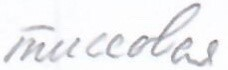тиссовая
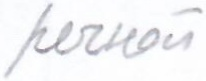речной
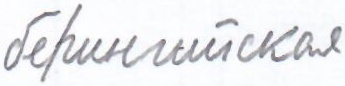берингийская
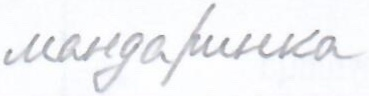мандаринка
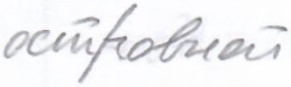островной
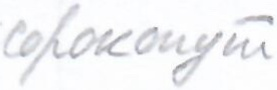сорокопут
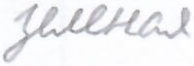зеленая
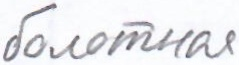болотная
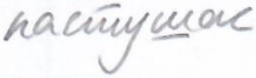пастушок
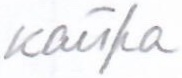кайра
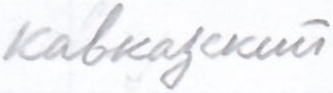кавказский
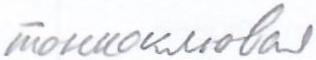тонкоклювая
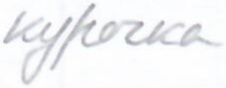курочка
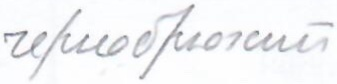чернобрюхий
